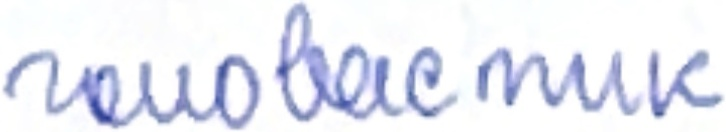головастик
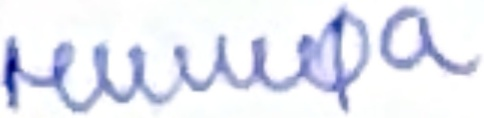нимфа
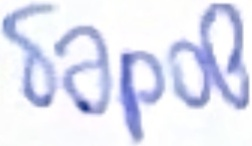бэров
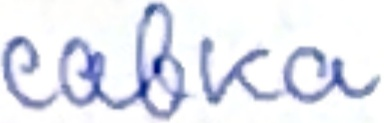савка
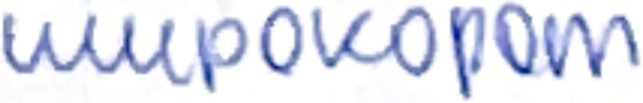широкорот
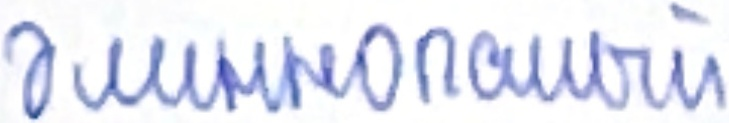длиннопалый
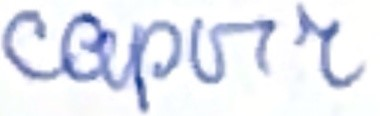сарыч
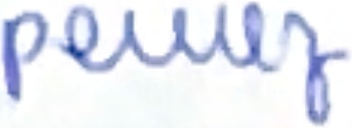ремез
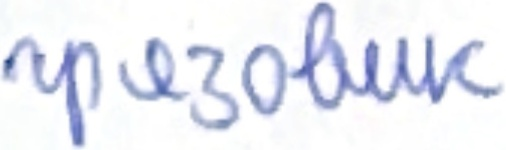грязовик
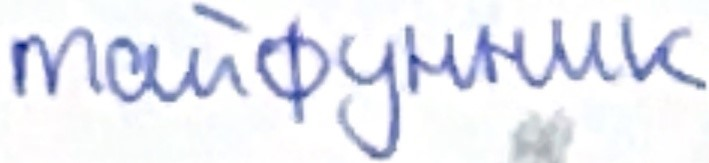тайфунник
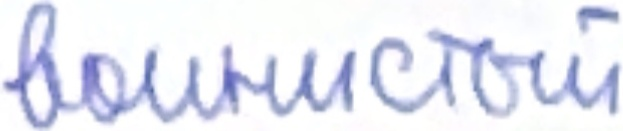волнистый
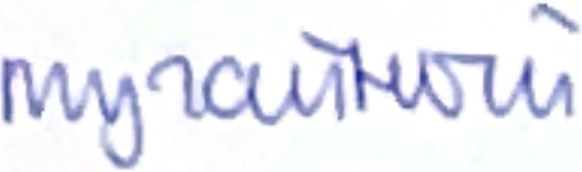тугайный
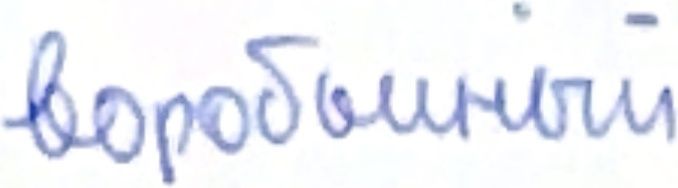воробьиный
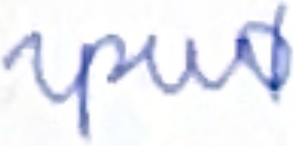гриф
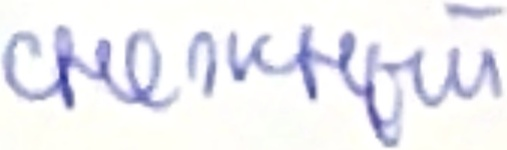снежный
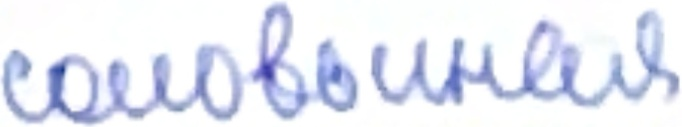соловьиная
